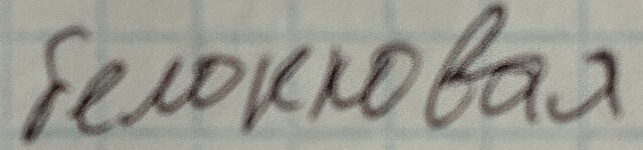белокловая
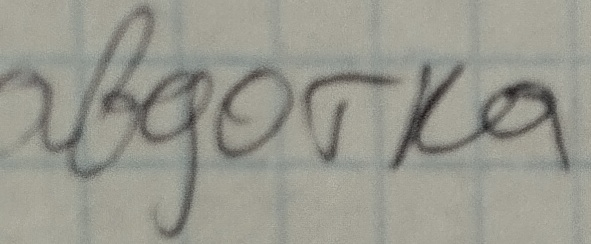авдотка
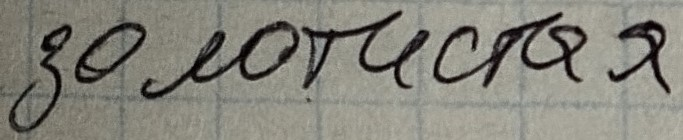золотистая
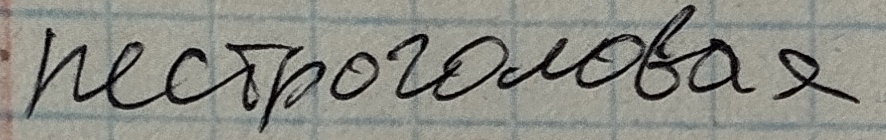пестроголовая
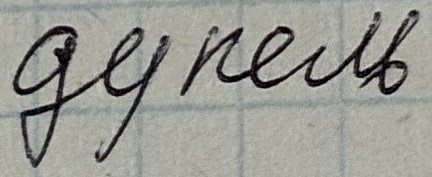дупель
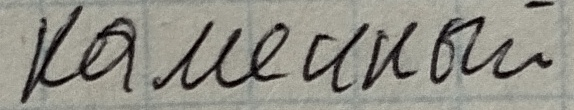каменный
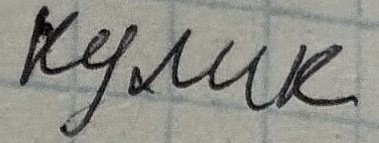кулик
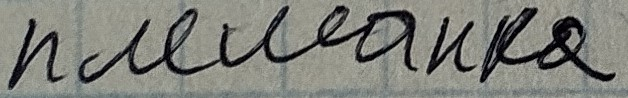плешанка
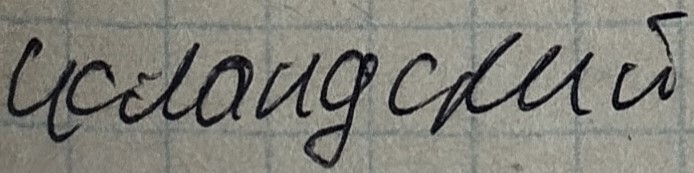исландский
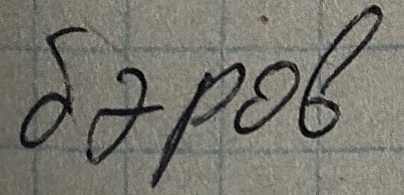бэров
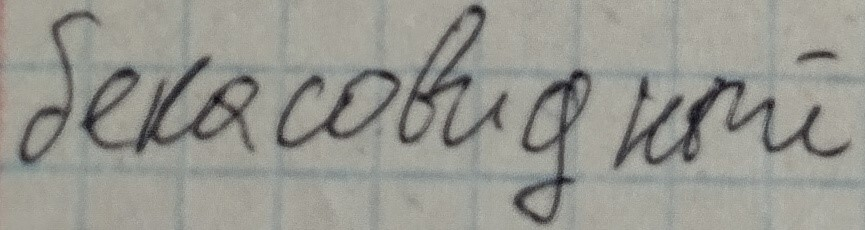бекасовидный
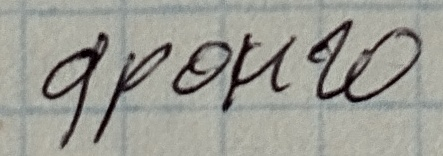дронго
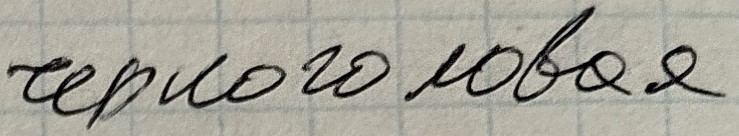черноголовая
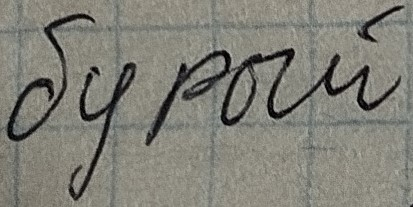бурый
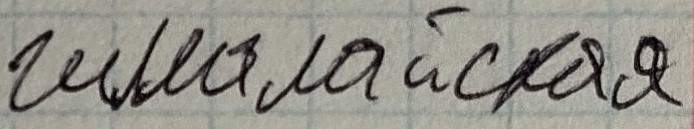гималайская
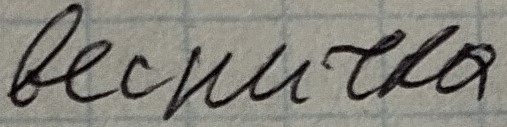весничка
